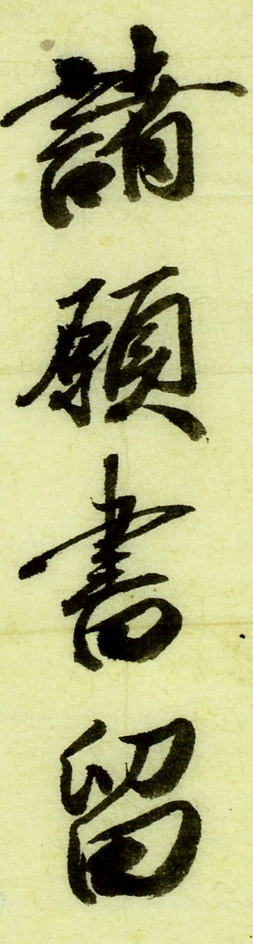諸願書留
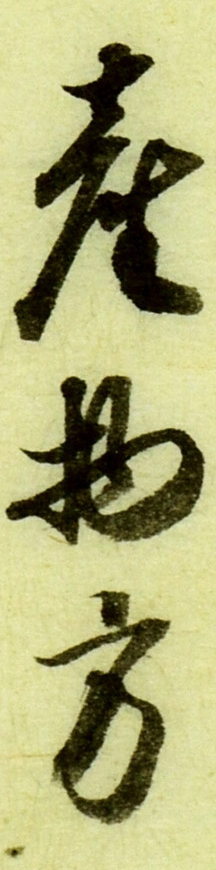産物方

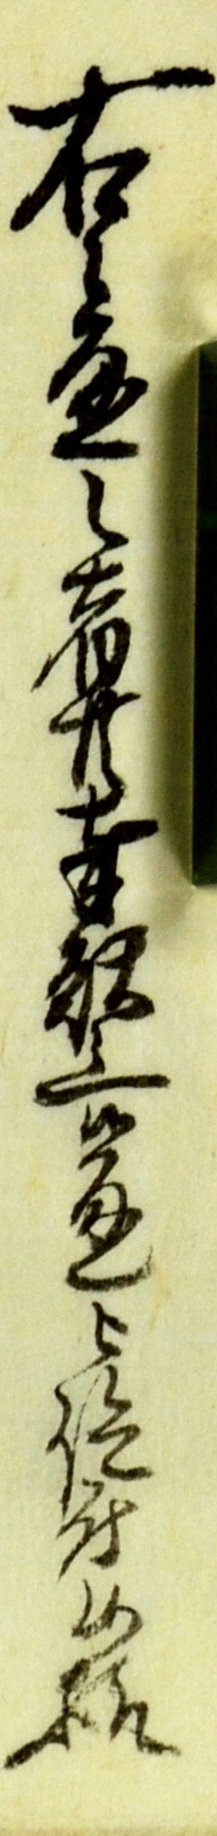右之通之者共奉願上候通被仰付候様
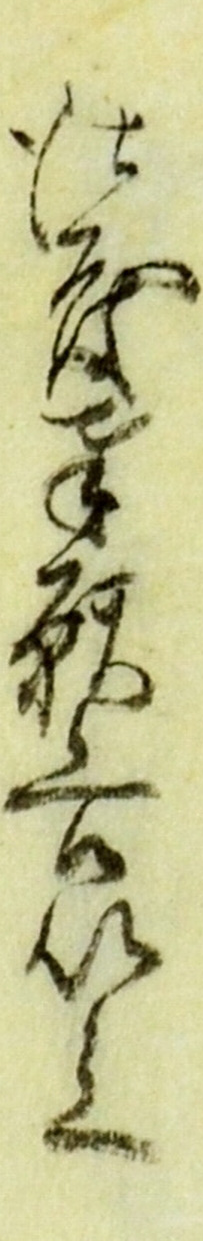仕度奉願上候以上
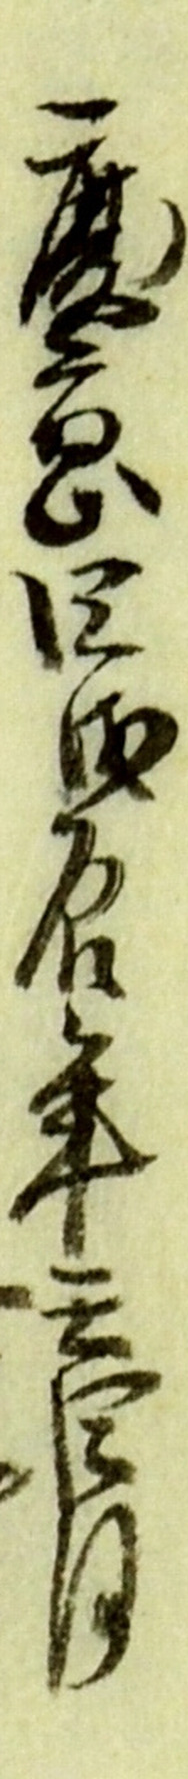慶應四戊辰年閏四月
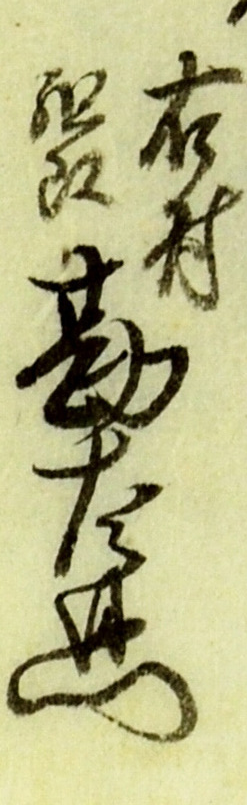組頭勘左衛門
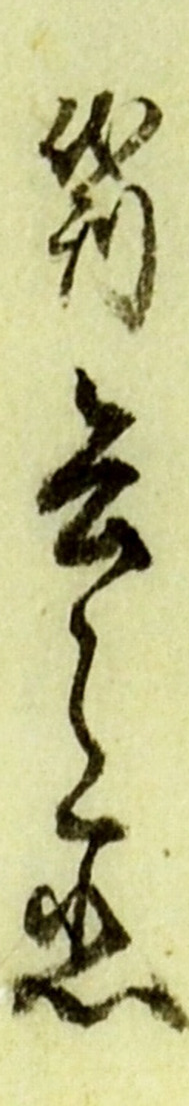代判兵之丞
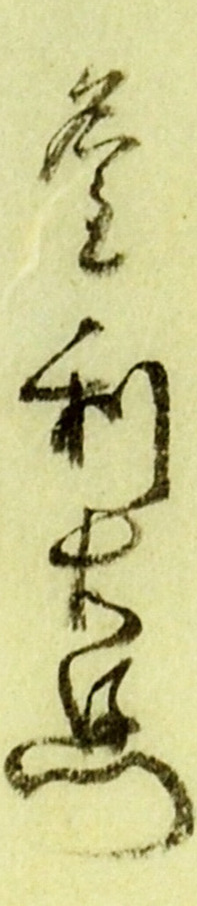名主利右衛門
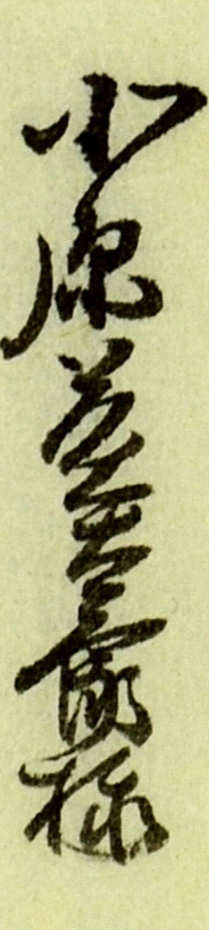北原益太郎様
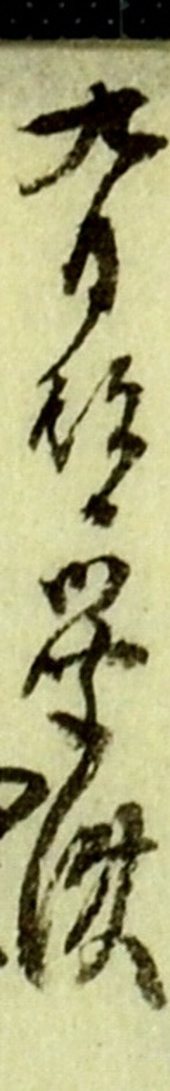九月朔日御聞済
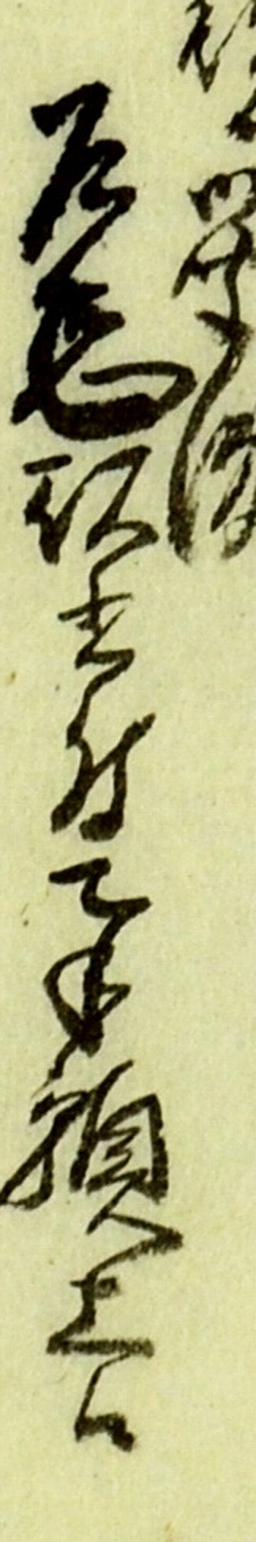乍恐以書付奉願上候
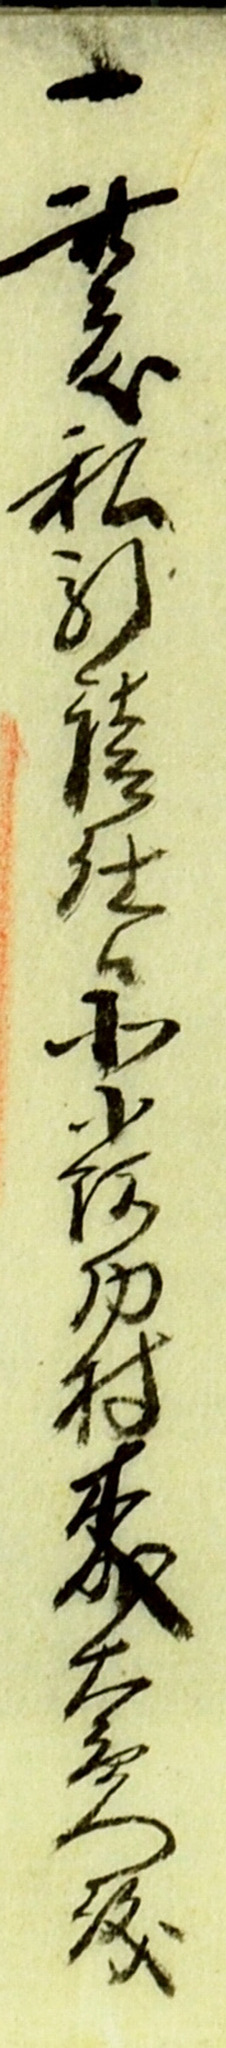一此度私引続仕候北小河内村森右衛門儀
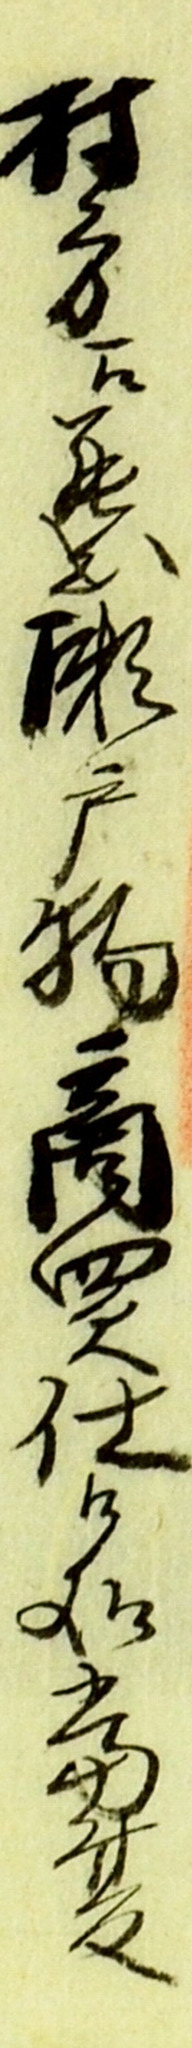村方江罷出瀬戸物商売仕候処当夏
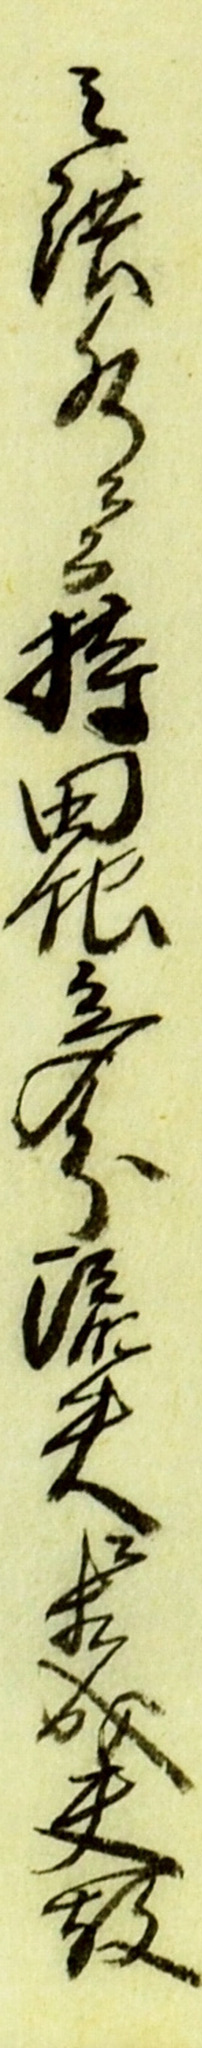之洪水ニ而持田地多分流失ニ相成夫故
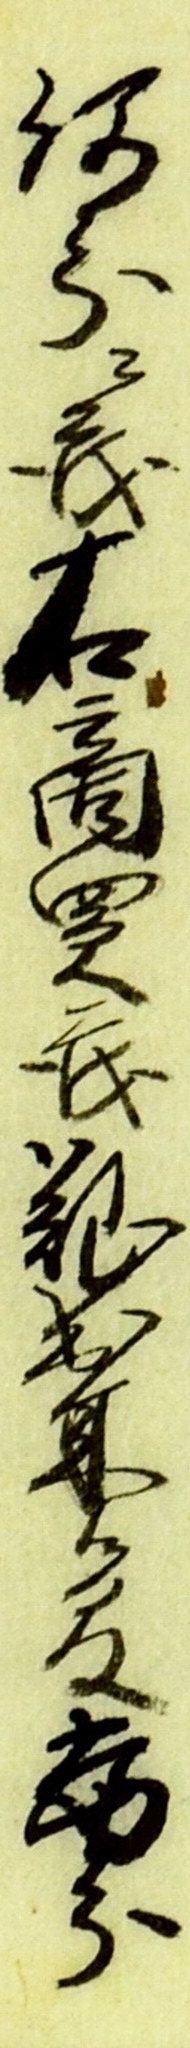何分ニ茂右商売茂難出来候間当分
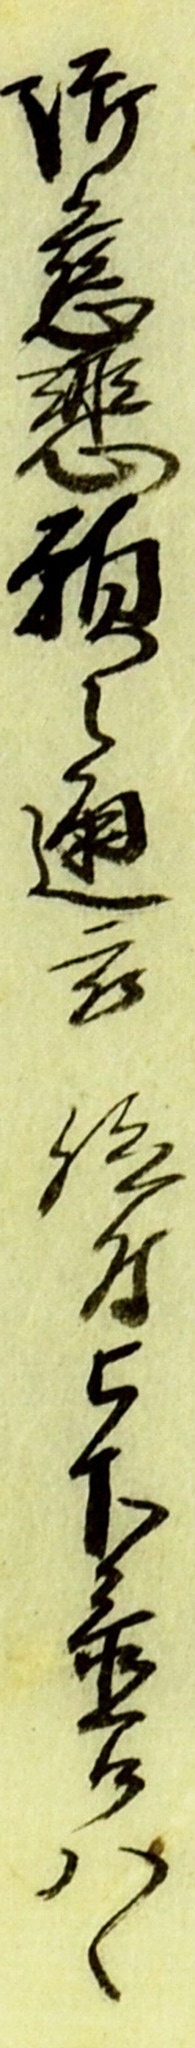御慈悲願之通被仰付被下置候ハゝ
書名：諸願書留
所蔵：伊那市立高遠町図書館・合同会社AMANE
